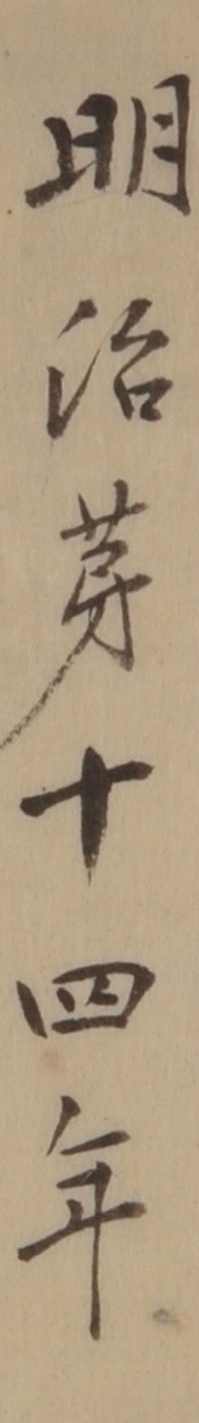明治第十四年
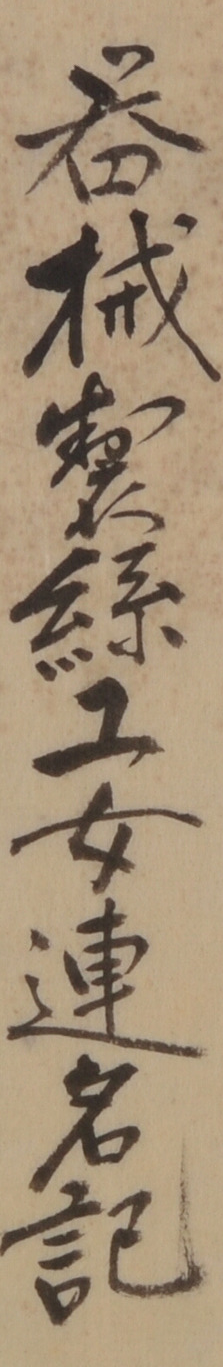器械製糸工女連名記
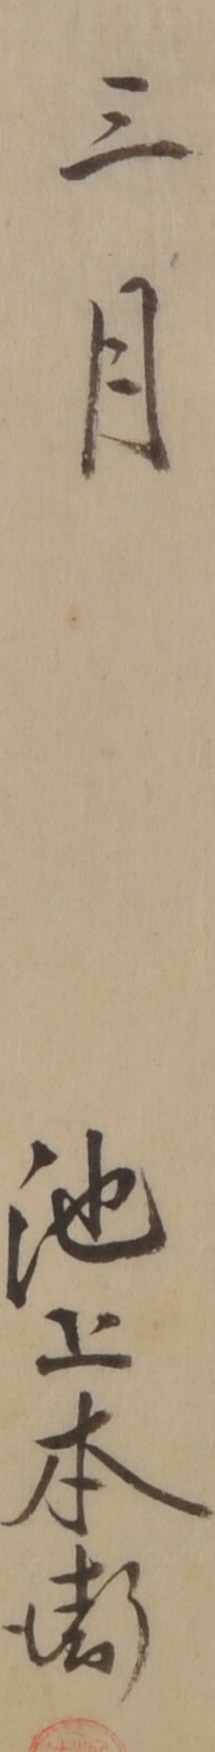三月池上本衛㊞

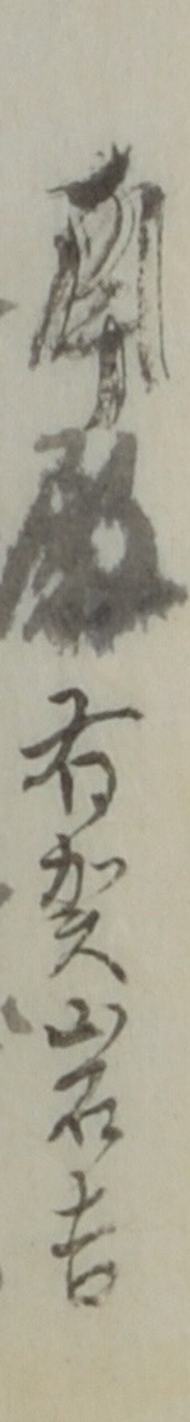南殿有賀岩吉
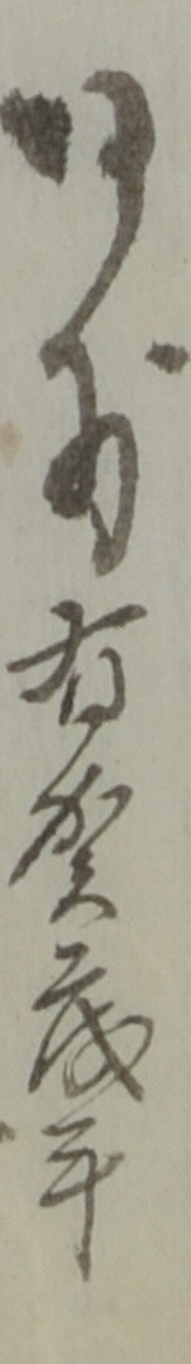一同前有賀茂平
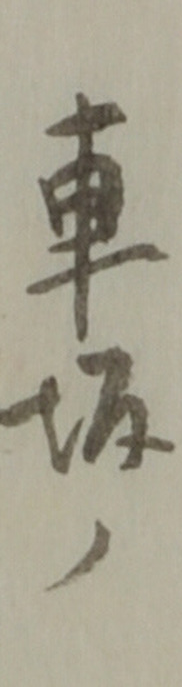車坂ノ
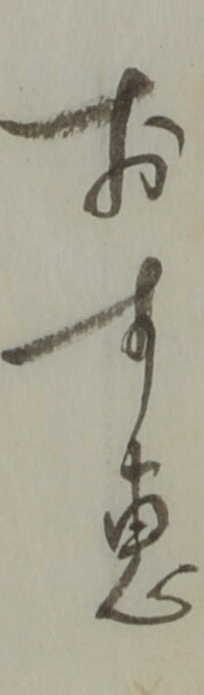おす恵
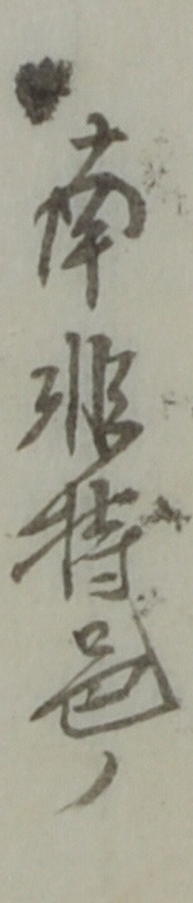南非持邑ノ

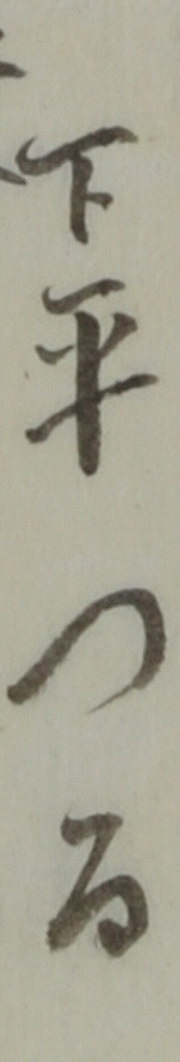下平つる
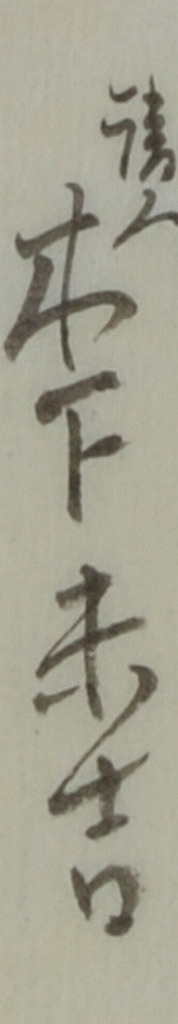木下未吉
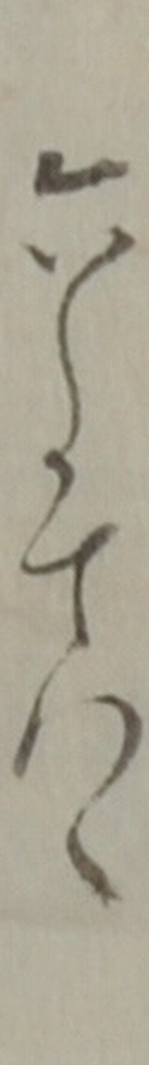六月十六日
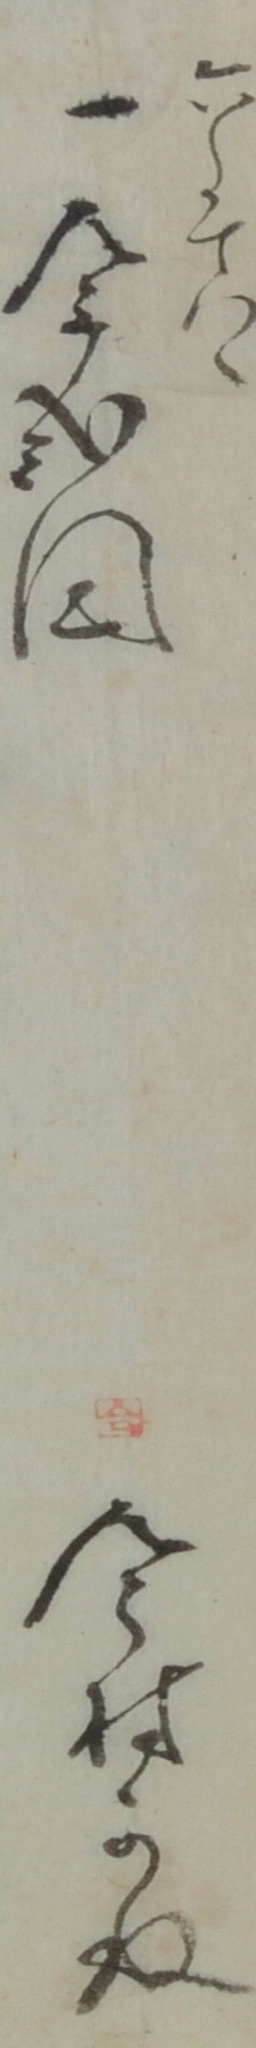一金弐円今村かね
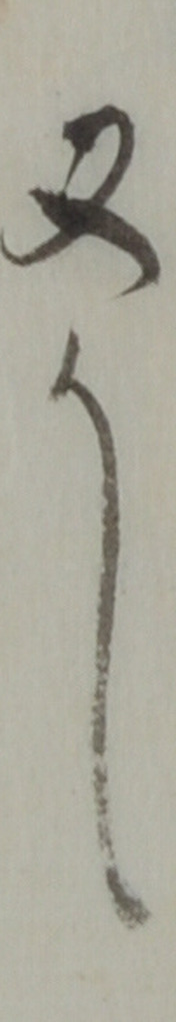又かし
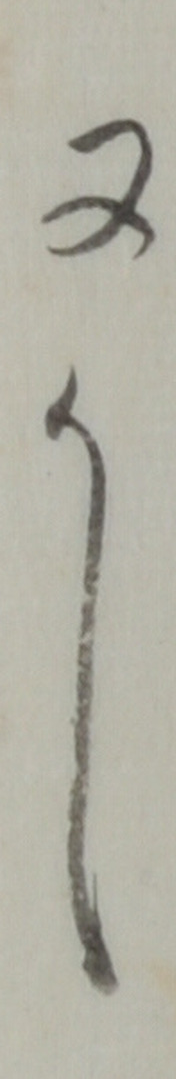又かし
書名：器械製糸工女連名記
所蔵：伊那市立高遠町図書館・合同会社AMANE
